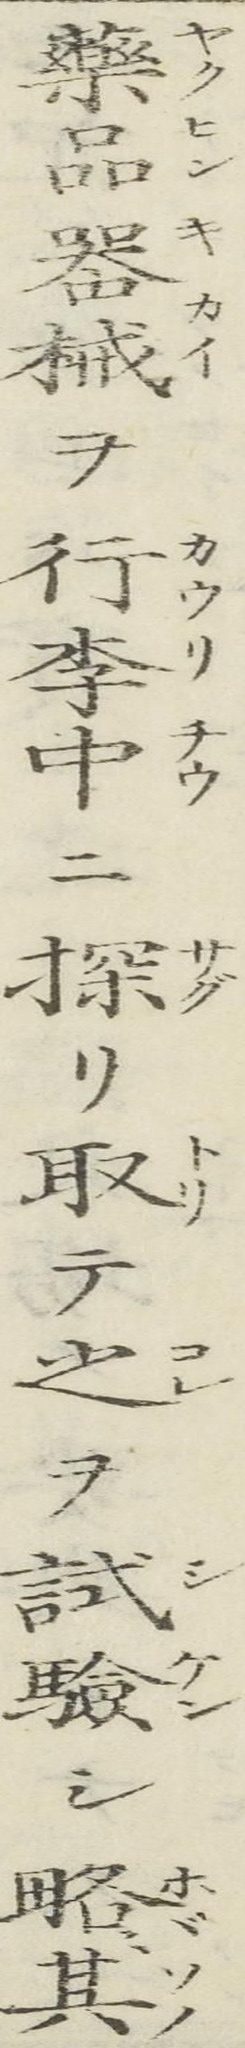薬品器械ヲ行李中ニ探リ取テ之ヲ試験シ略其
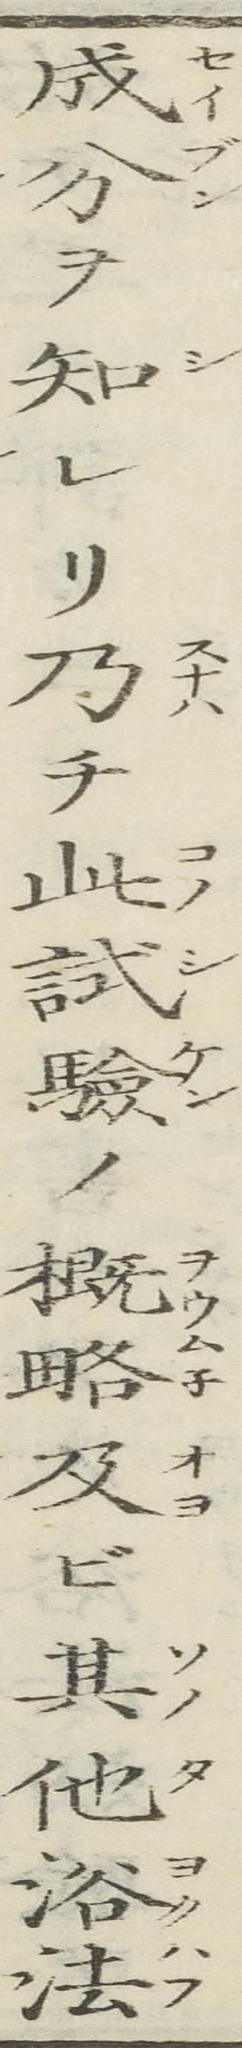成分ヲ知レリ乃チ此試験ノ概略及ビ其他浴法
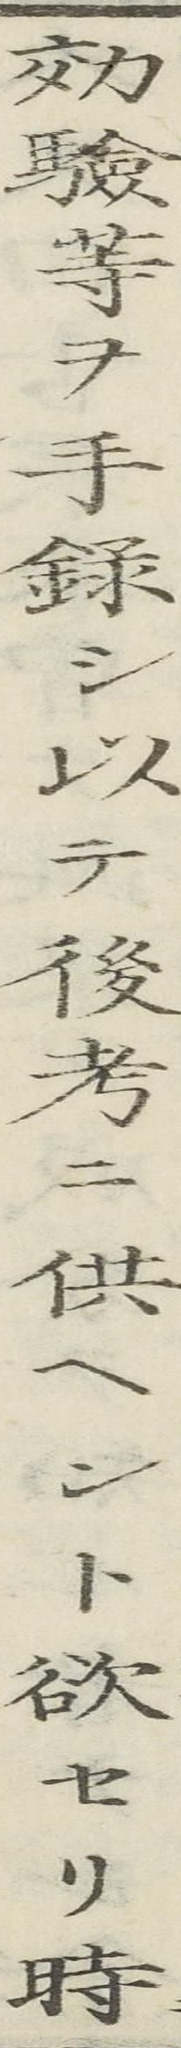効験等ヲ手録シ以テ後考ニ供ヘント欲セリ時
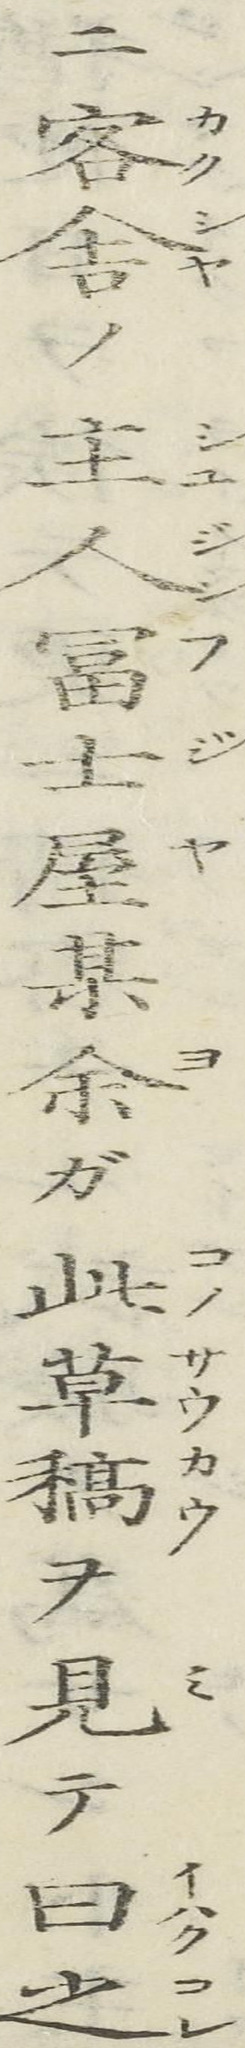ニ客舎ノ主人冨士屋某余ガ此草稿ヲ見テ曰之
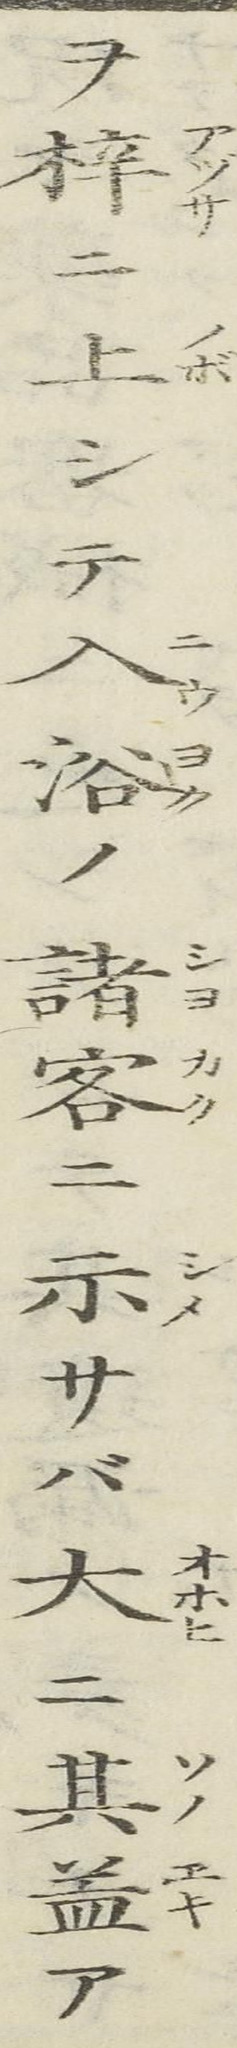ヲ梓ニ上シテ入浴ノ諸客ニ示サバ大ニ其益ア
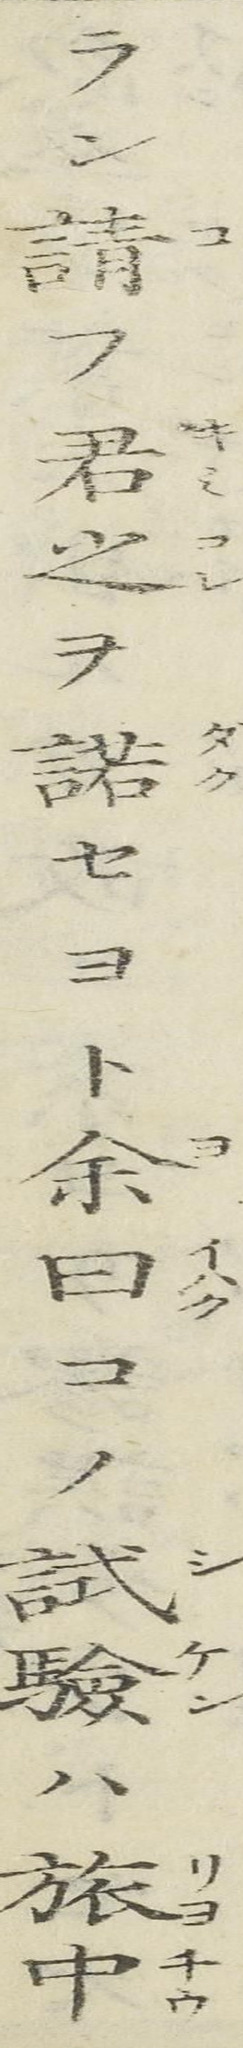ラン請フ君之ヲ諾セヨト余曰コノ試験ハ旅中

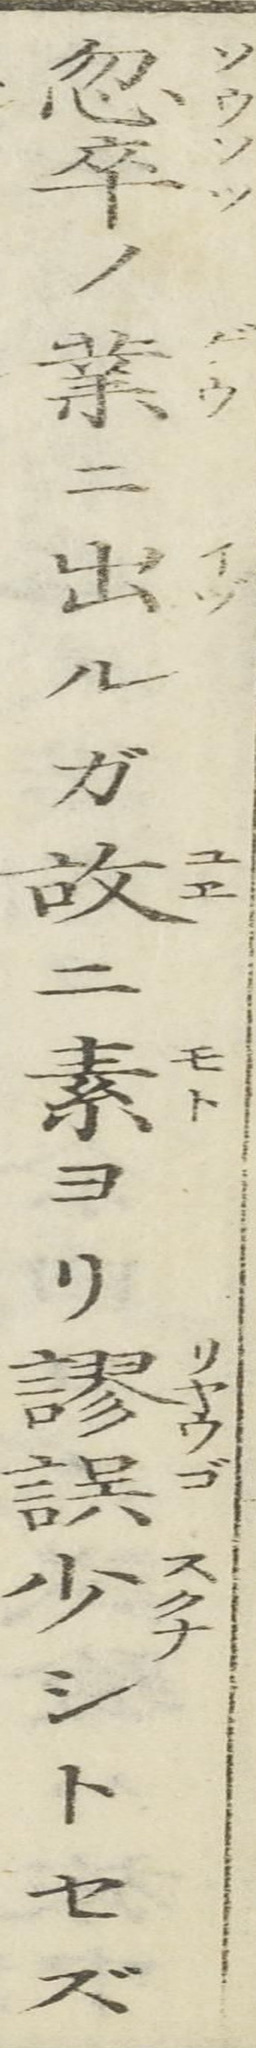忽卒ノ業ニ出ルガ故ニ素ヨリ謬誤少シトセズ

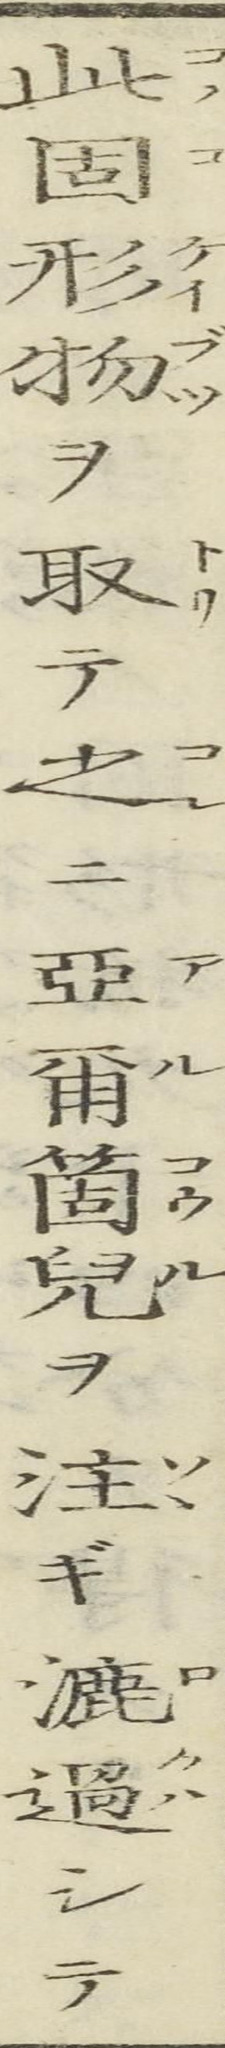此固形物ヲ取テ之ニ亜爾箇兒ヲ注ギ濾過シテ
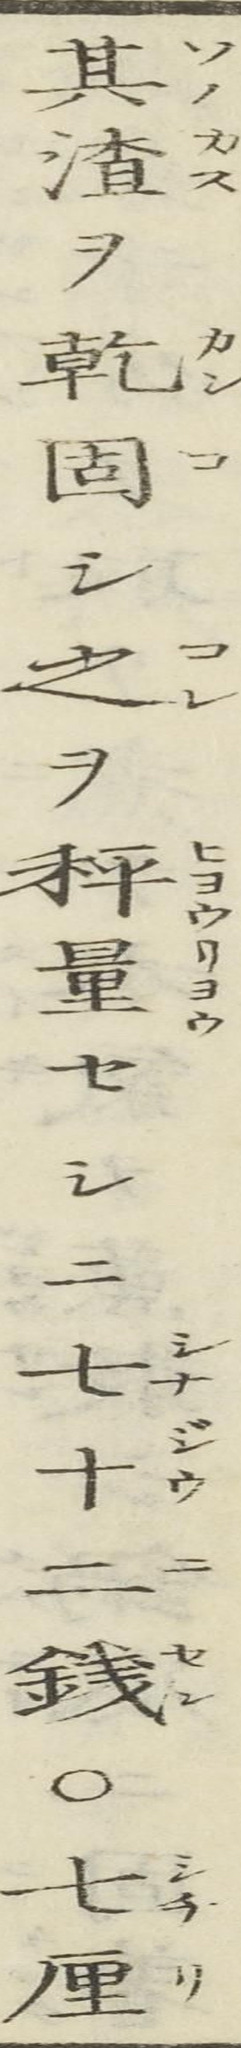其渣ヲ乾固シ之ヲ秤量セシニ七十二銭〇七厘
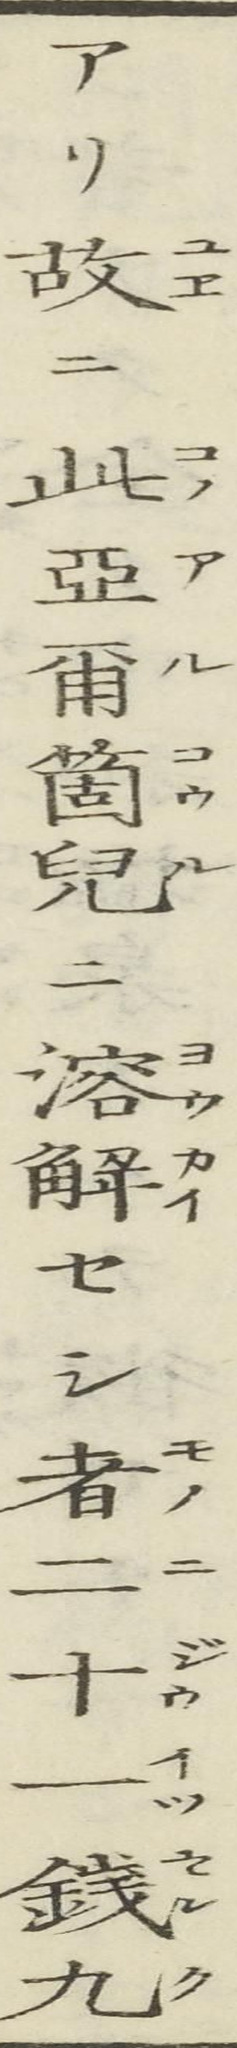アリ故に此亜爾箇兒ニ溶解セシ者二十一銭九
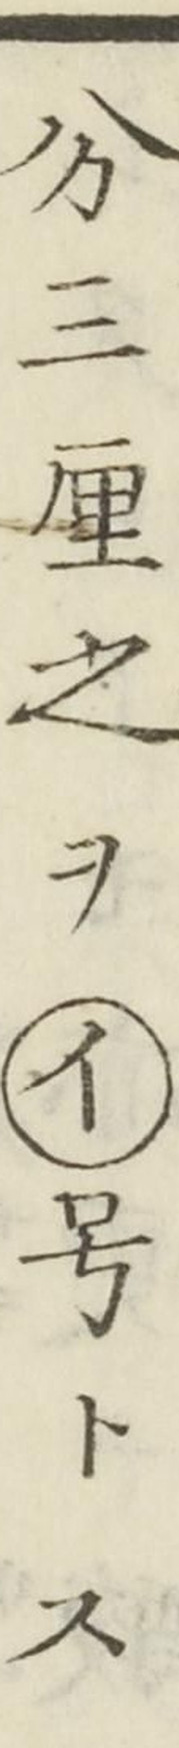分三厘之ヲ㋑号トス
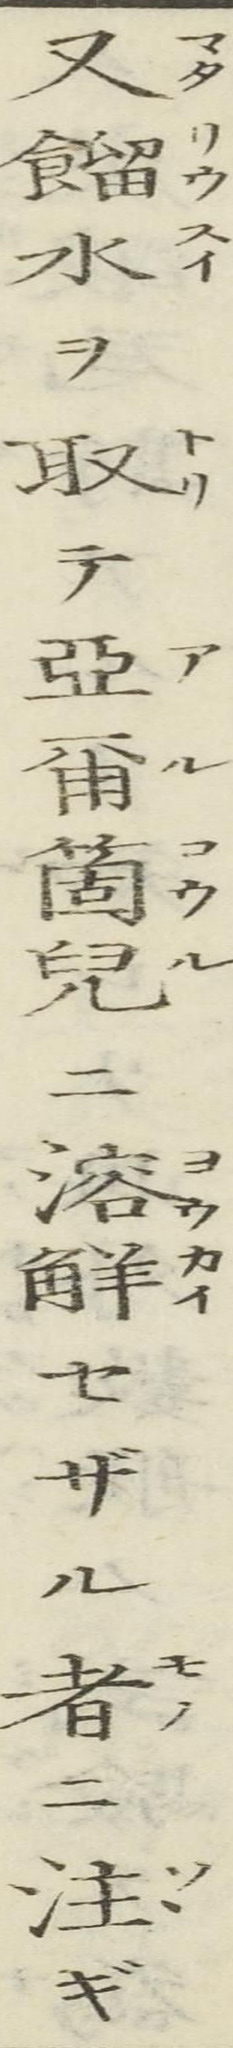又溜水ヲ採テ亜爾箇兒ニ溶解セザル者ニ注ギ
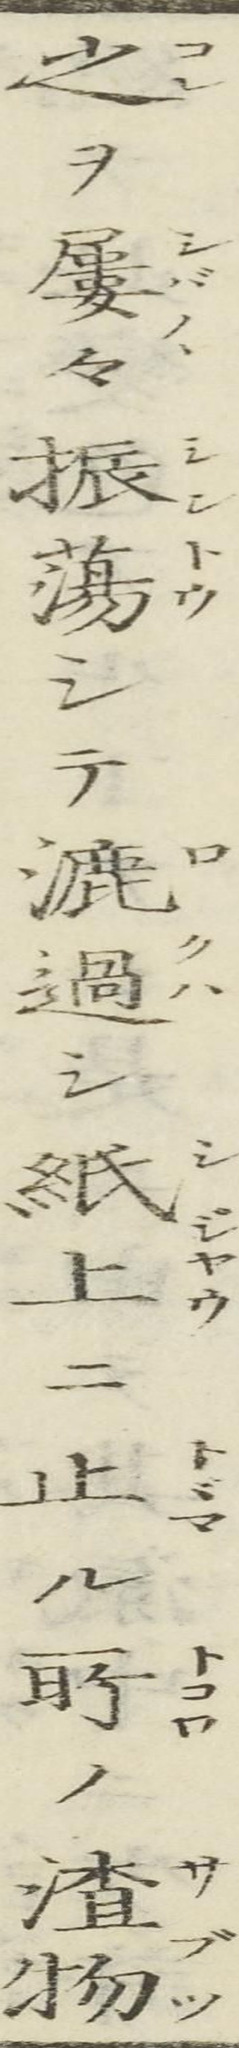之ヲ屡々振蕩シテ濾過シ紙上ニ止ル所ノ渣物
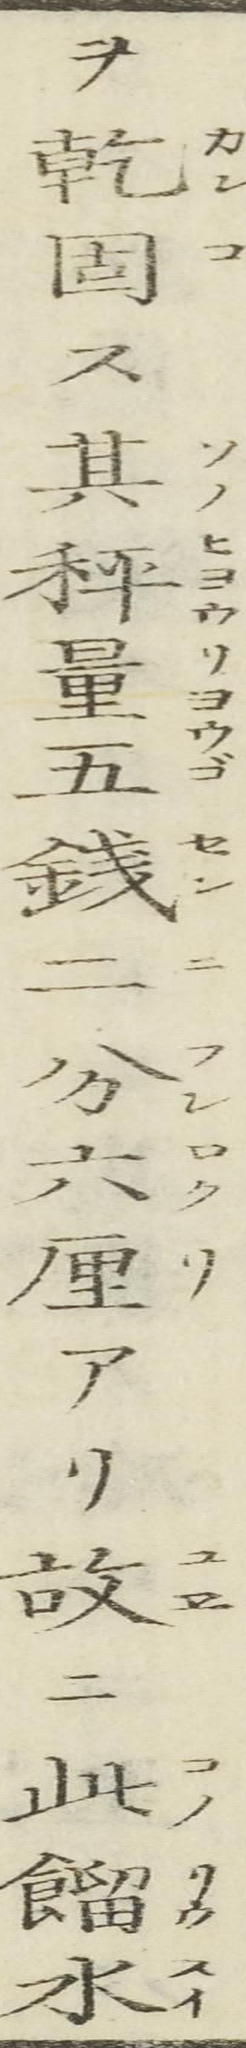ヲ乾固ス其秤量五銭二分六厘アリ故ニ此溜水
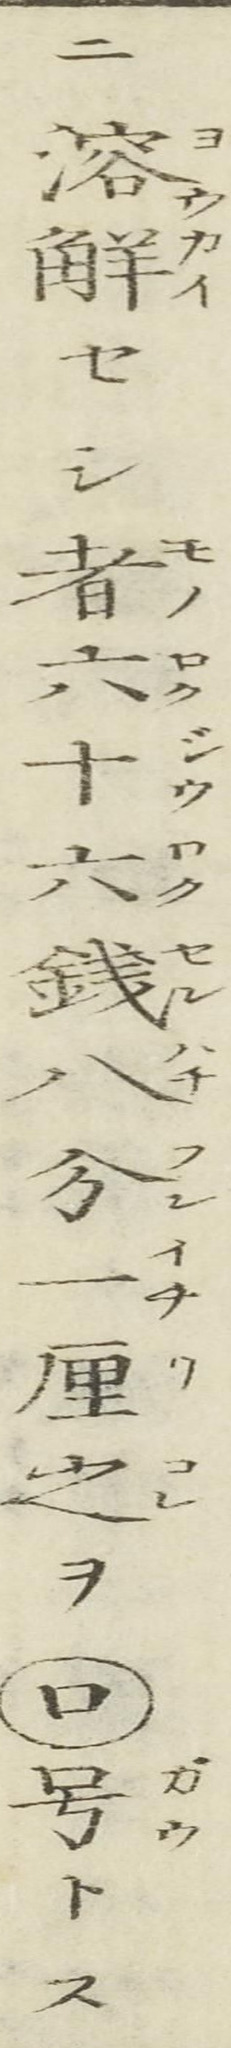ニ溶解セシ者六十六銭八分一厘之ヲ㋺号トス
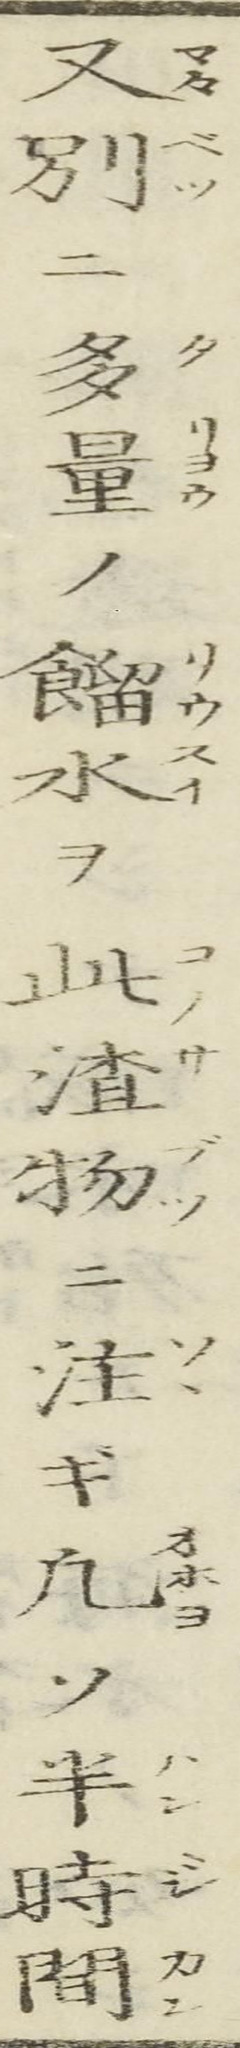又別ニ多量ノ溜水ヲ此渣物ニ注ギ凡ソ半時間
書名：熱海温泉考　全
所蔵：東京大学地震研究所図書室 Earthquake Research Institute Library, The University of Tokyo, JAPAN
